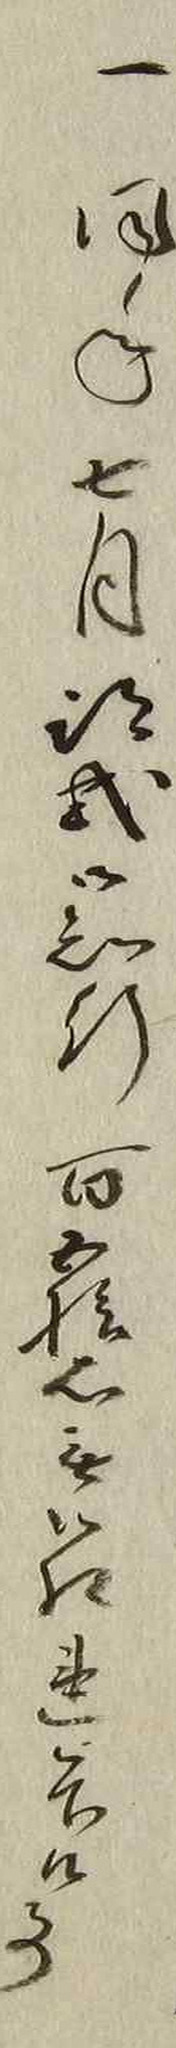一同年七月跡式御知行百五拾石無御相違被下候事
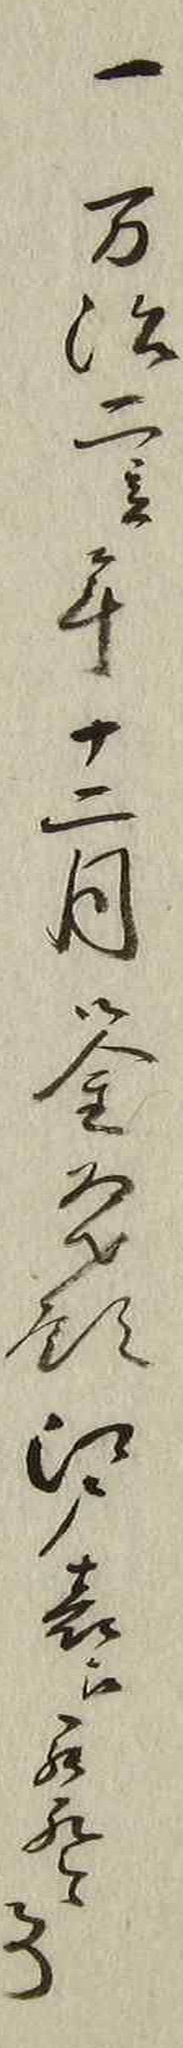一万治二亥年十二月御金為才領江戸表江罷登候事
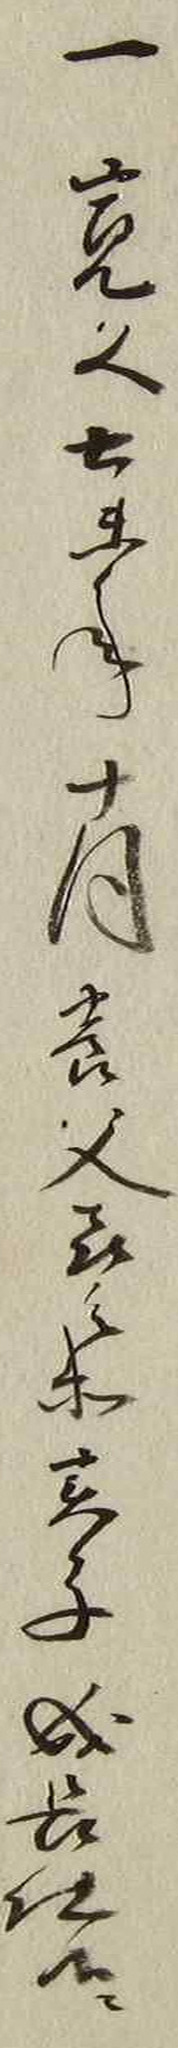一寛文七未年十月養父喜兵衛実子成長仕候に
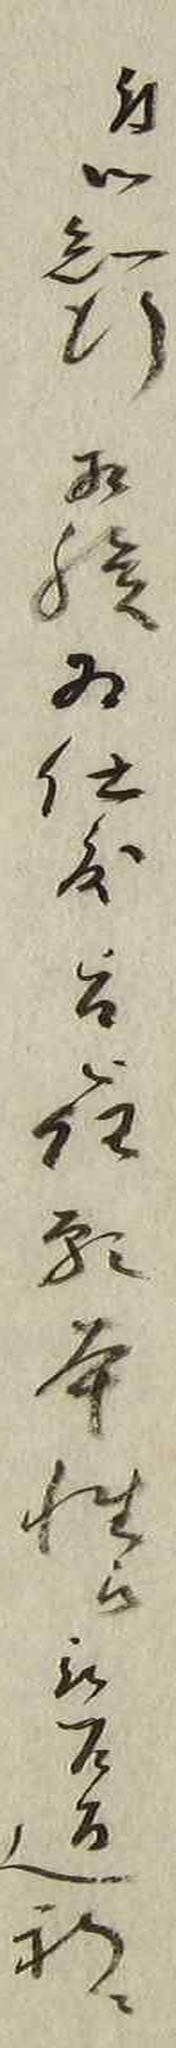付御知行相続為仕度旨被任願本性江被召返新に
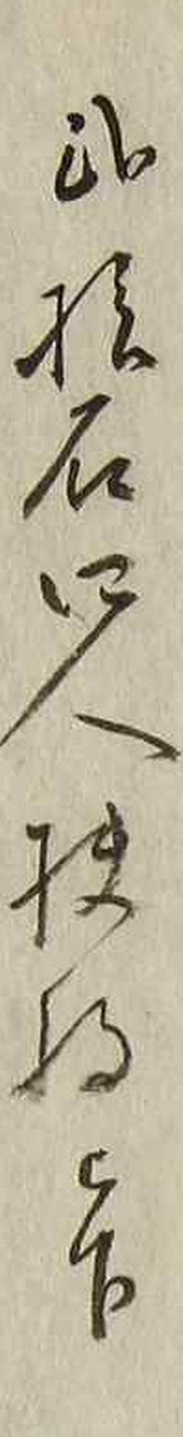弐拾石四人扶持被下
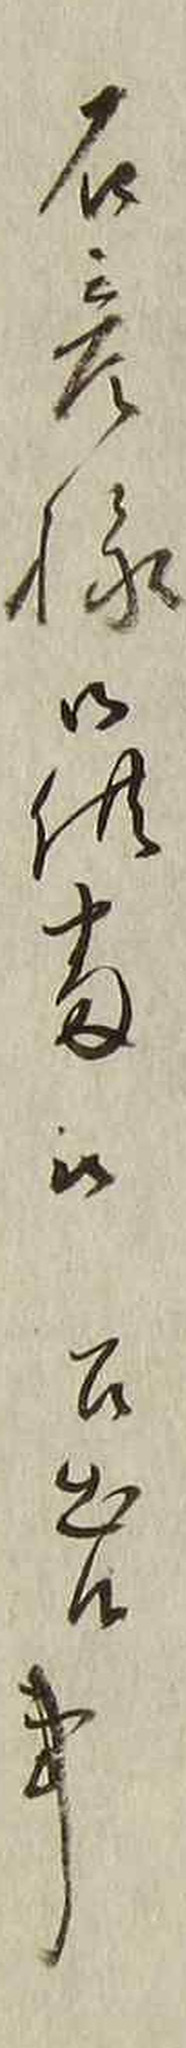石彦様御供番被召出候事

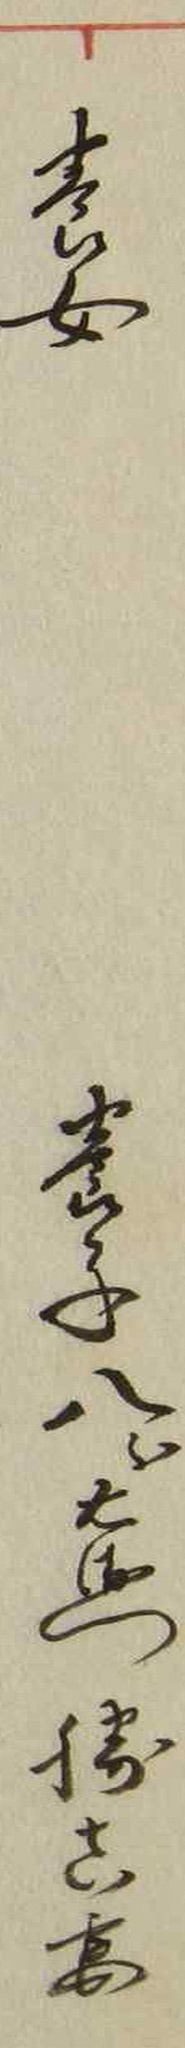養女養子八郎右衛門勝真妻
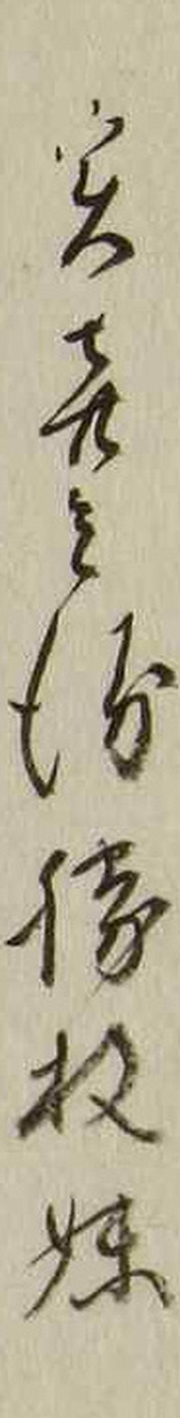実喜兵衛勝枝妹
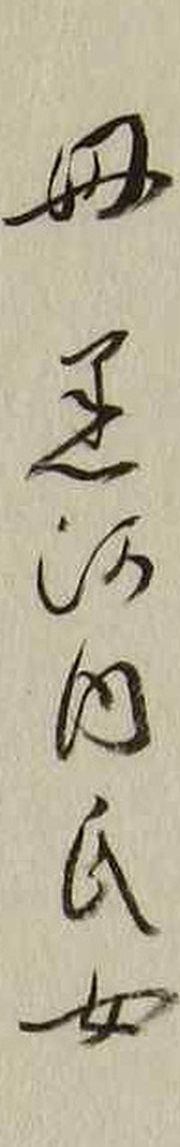母黒河内氏女
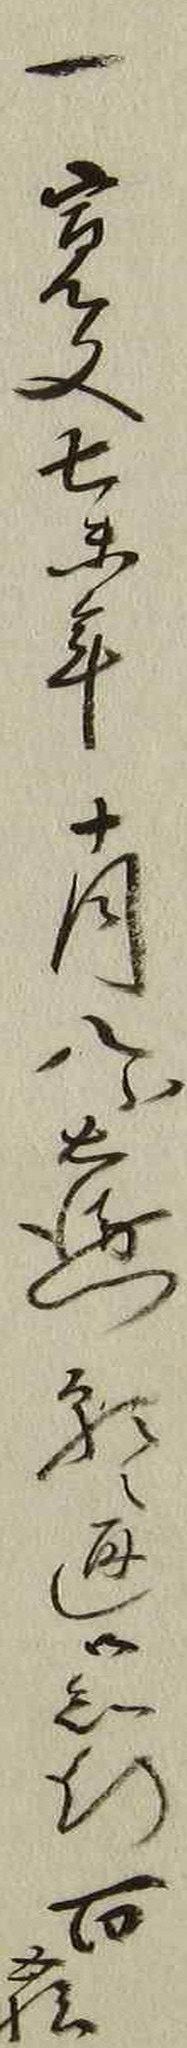一寛文七未年十月八郎右衛門願之通御知行百五拾
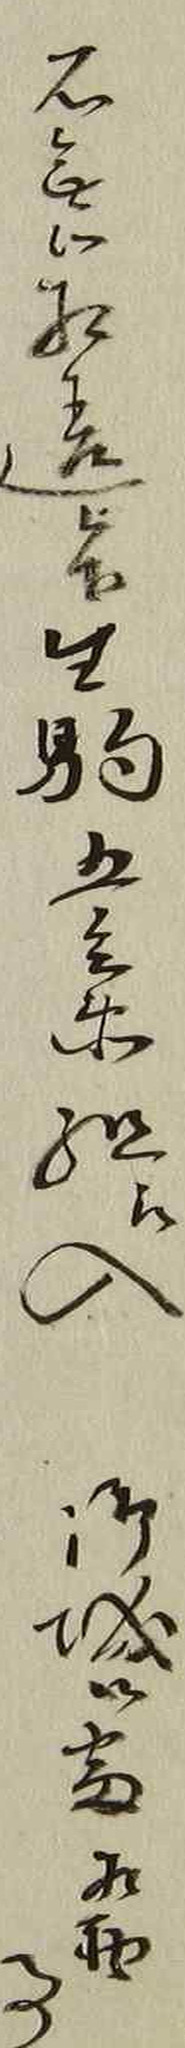石無御相違被下生駒五兵衛組江入御城御番相勤候事
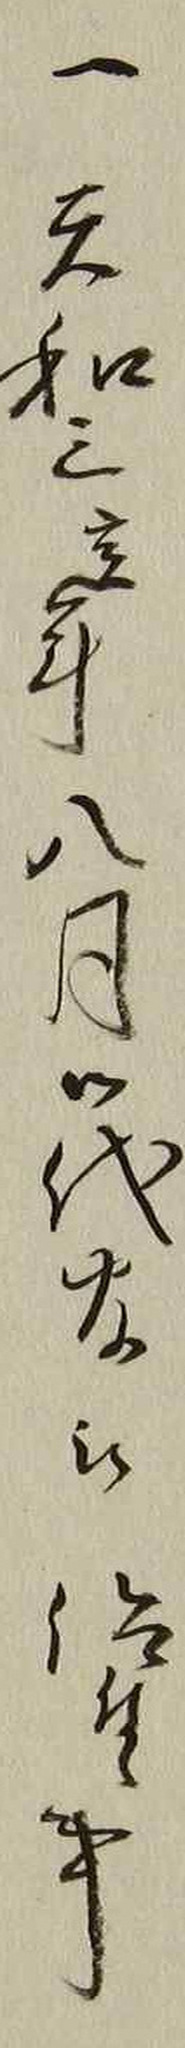一天和三亥年八月御代官被仰付候事
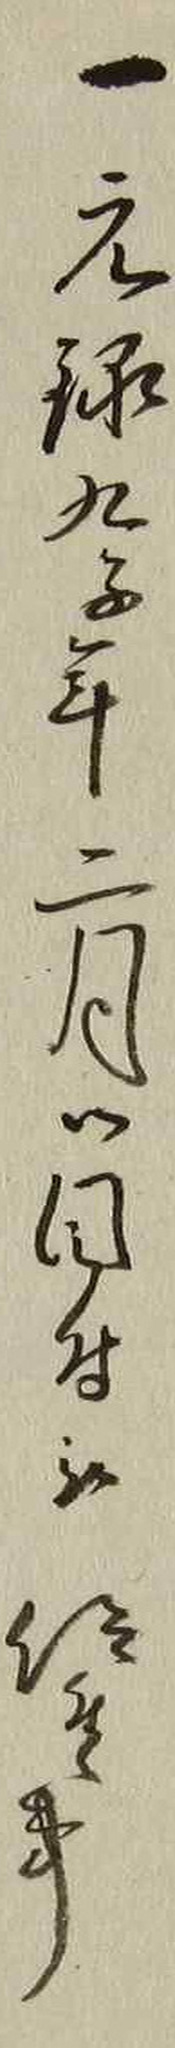一元禄九子年二月御目付被仰付候事
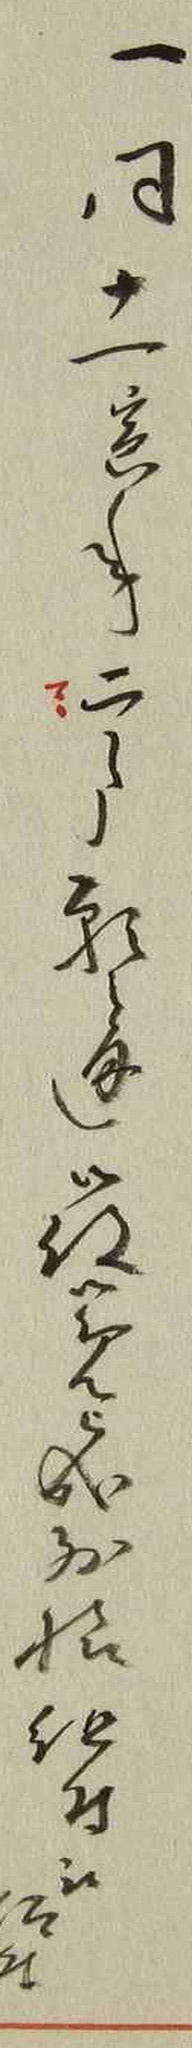一同十一寅年二月願之通御役御免被成外様組付被仰付
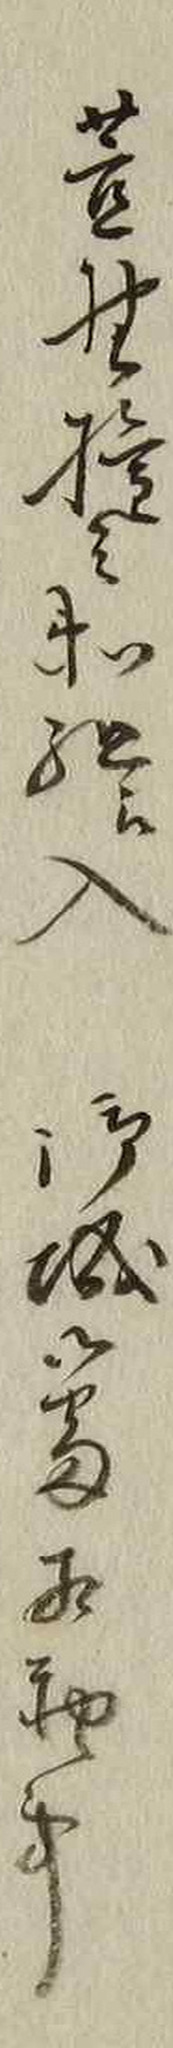萱野権兵衛組江入御城御番相勤候事
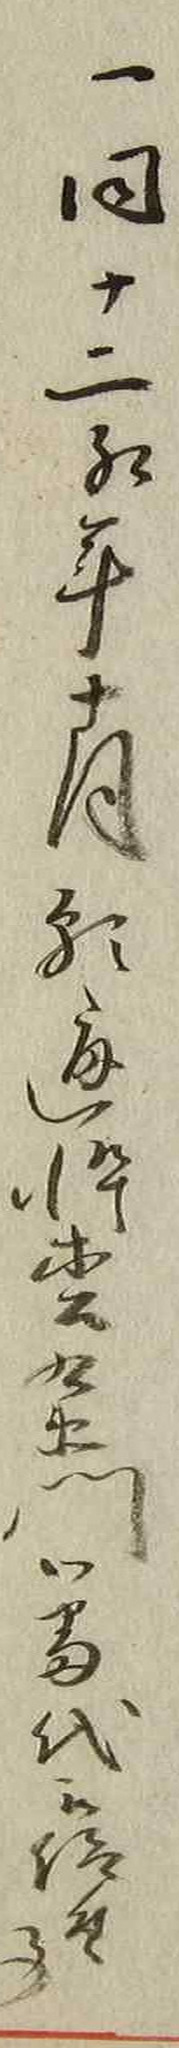一同十二卯年十月願之通忰杢右衛門御番代被仰付候事
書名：諸士系譜　巻之6　い之部6
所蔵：会津若松市立会津図書館
